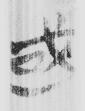或
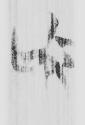收
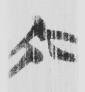六
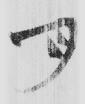月
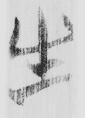生
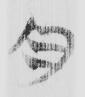肉
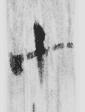七
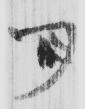月
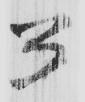乃
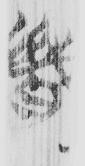{肉幾}
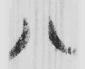八
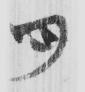月
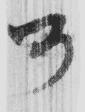乃
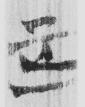正
